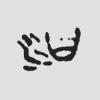泔
